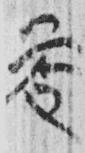而
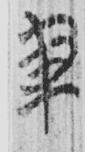車
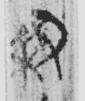○（梁）
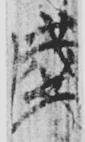城（成）
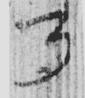乃
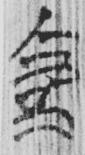命
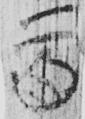百
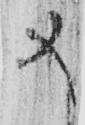又（有）
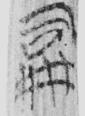○（司）
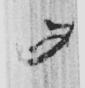曰
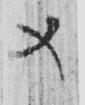又（有）
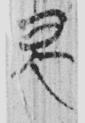○（夏）
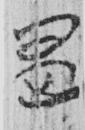是（氏）
